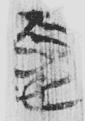惪（德）
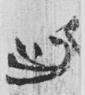此
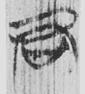君
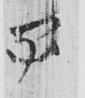子
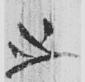之
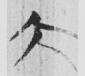大
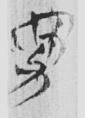○（務）
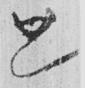也
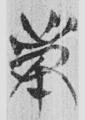庚
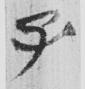子
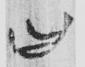曰
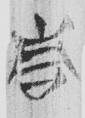青（請）
